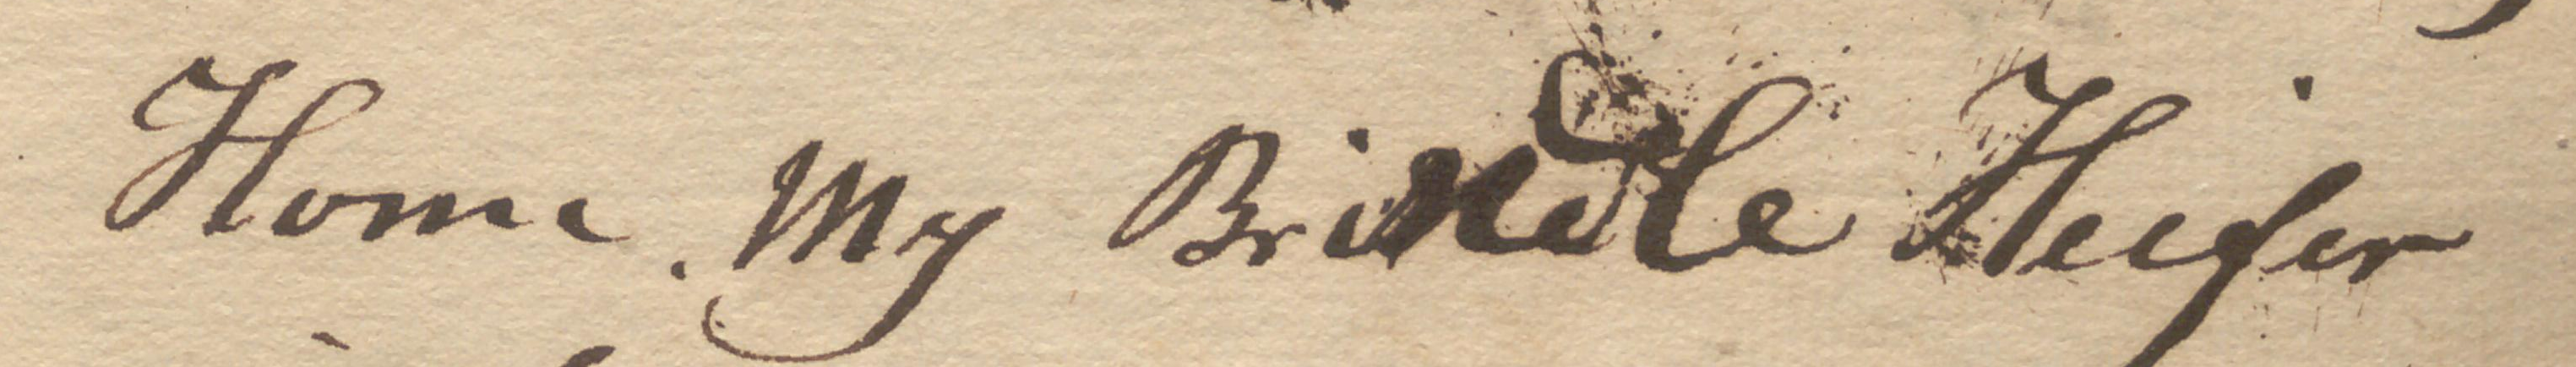Home My Britldle Heifer
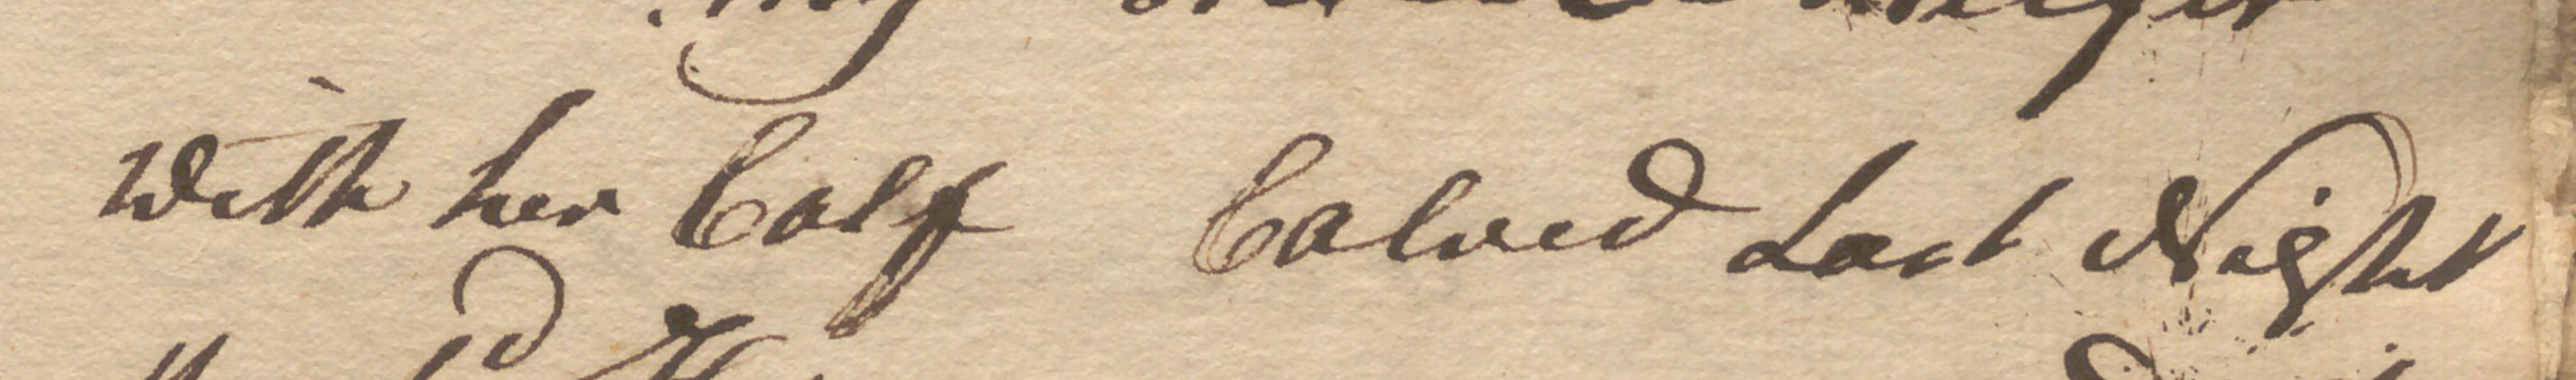with her Calf Calved Last Night
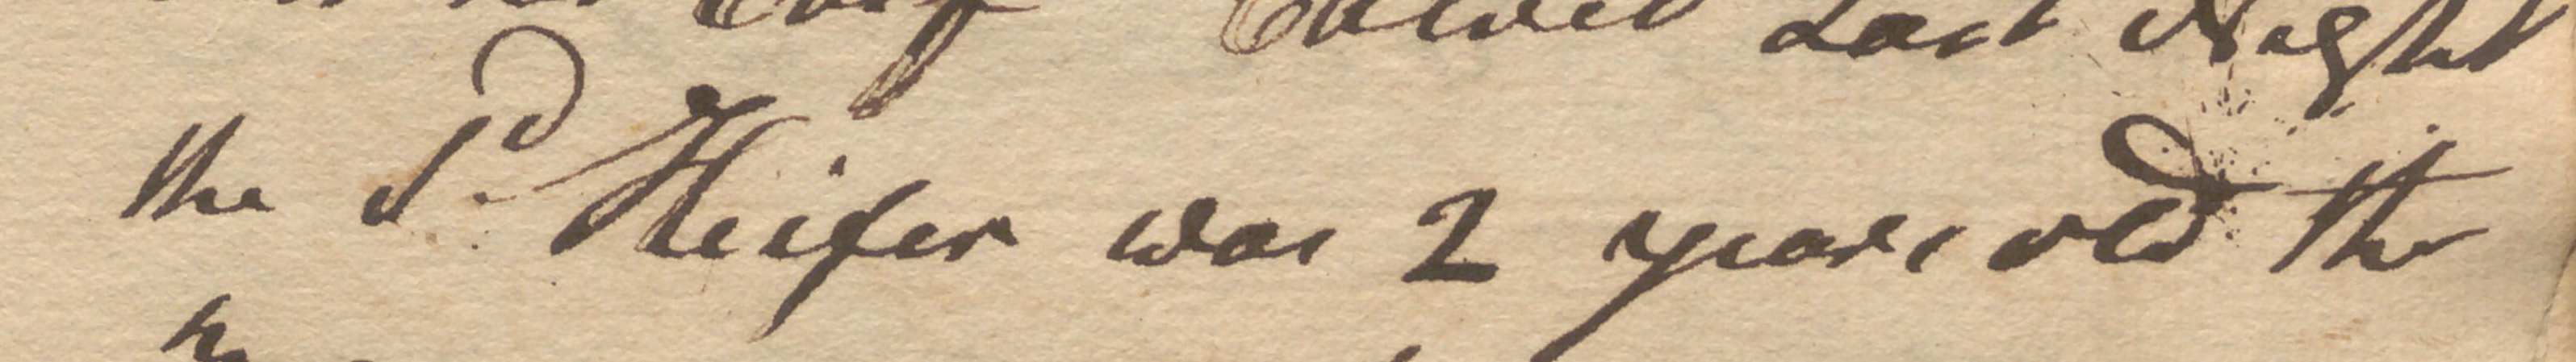the S^d. Heifer was 2 years old the
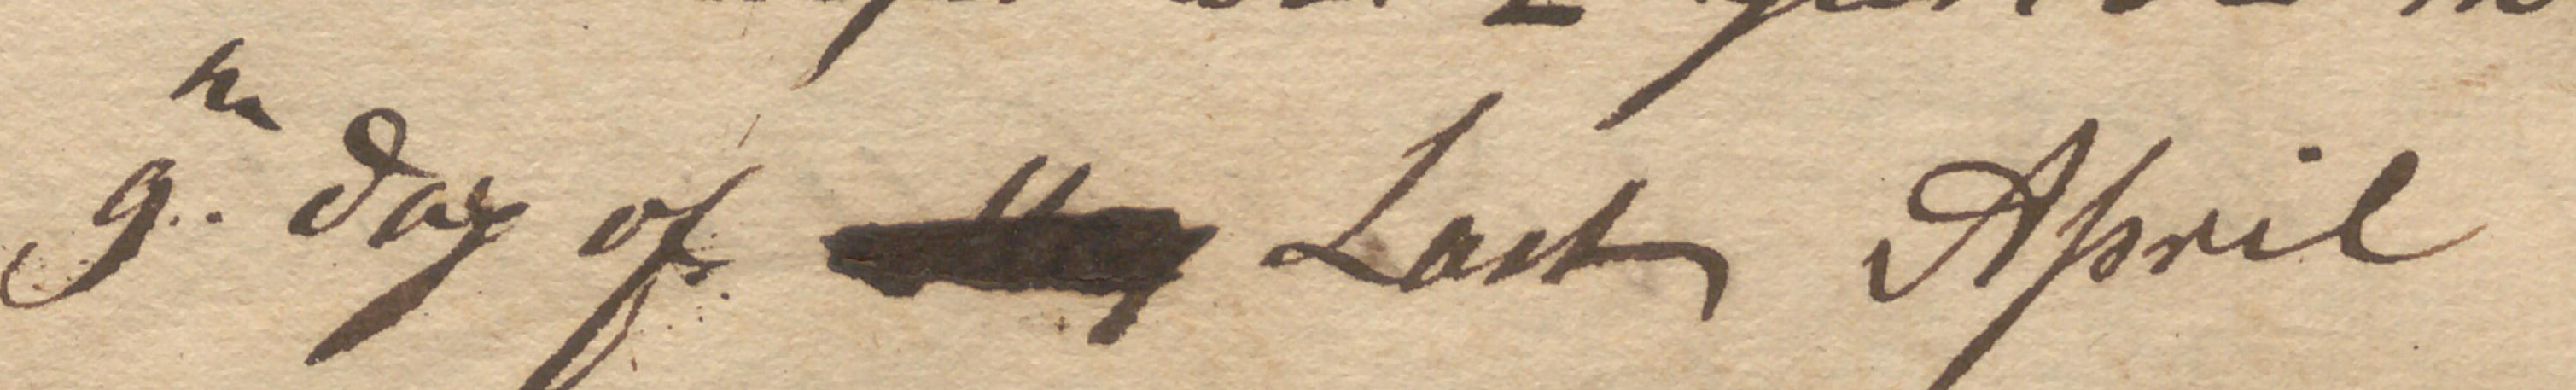9^t. day of [May] Last April
